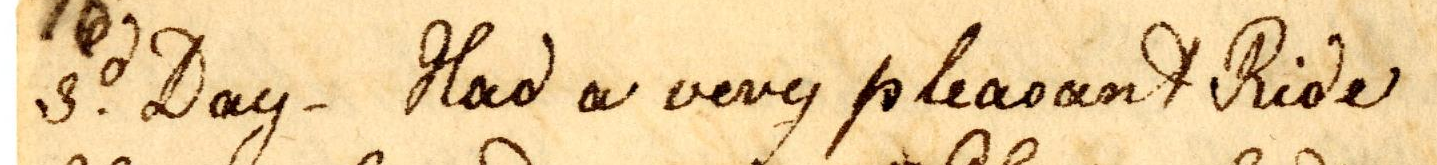3^d Day- Had a very pleasant Ride
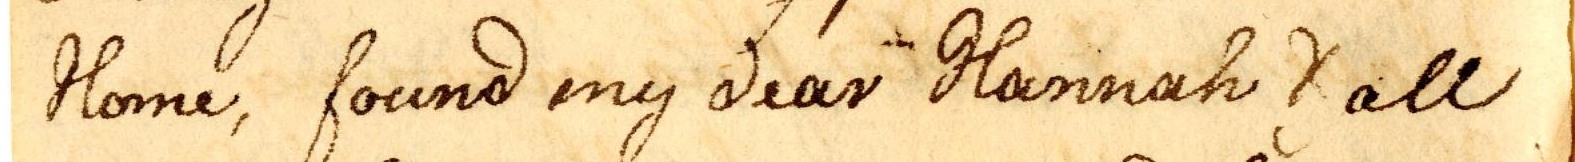Home, found my dear Hannah & all
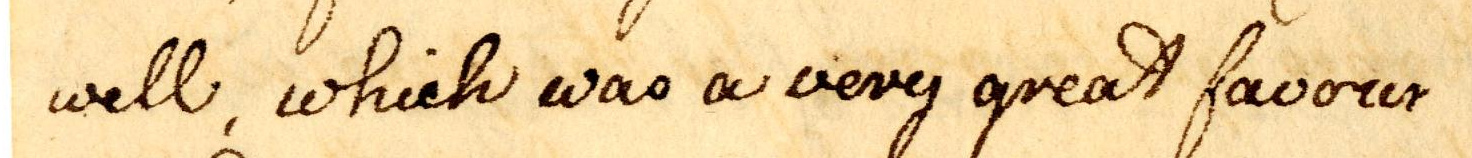well, which was a very great favour
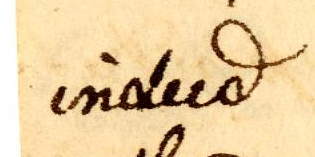indeed
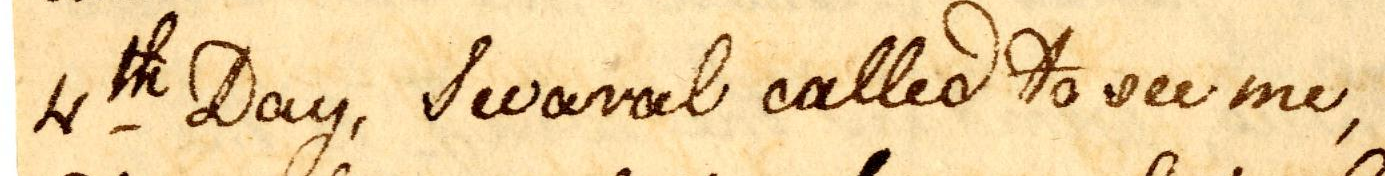4^th Day, Sevaral called to see me,
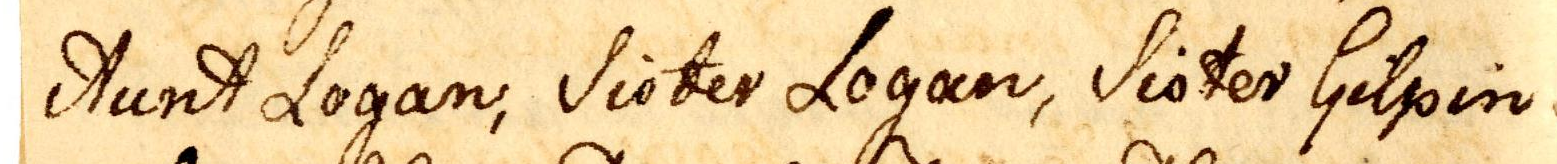Aunt Logan, Sister Logan, Sister Gilpin
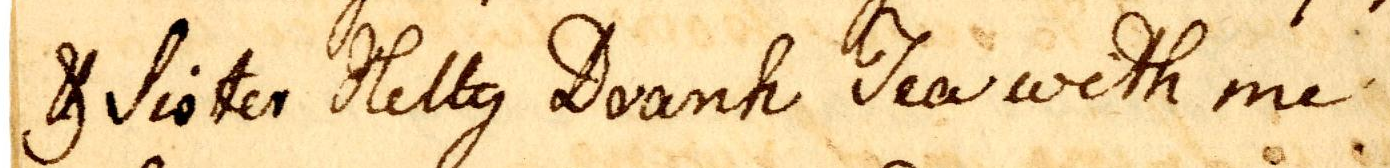& Sister Hetty Drank Tea with me
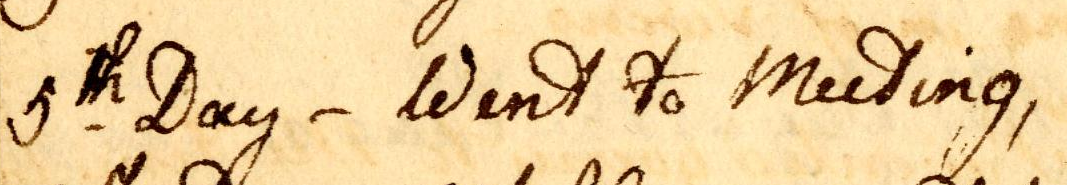5^th Day- Went to Meeting,
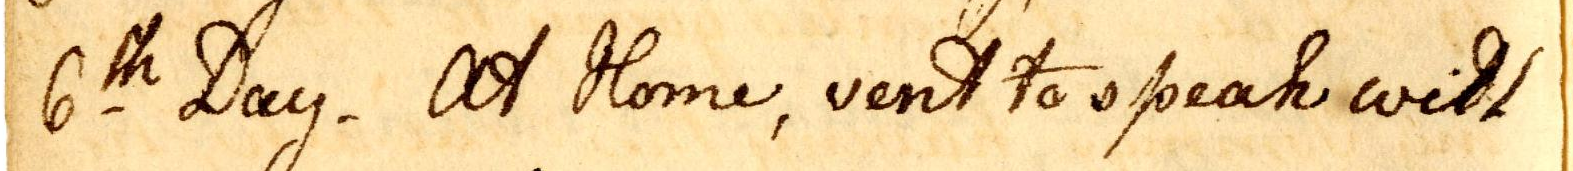6^th Day- At Home, sent to speak with
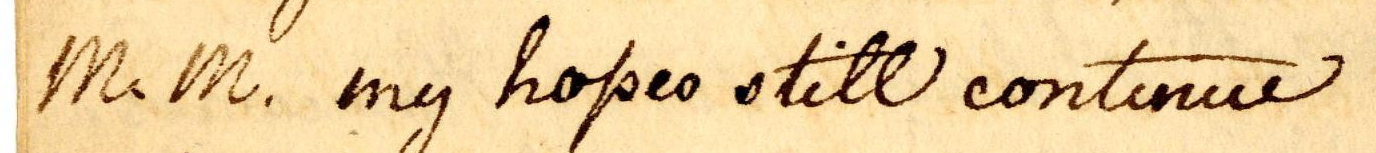M.M. my hopes still continue
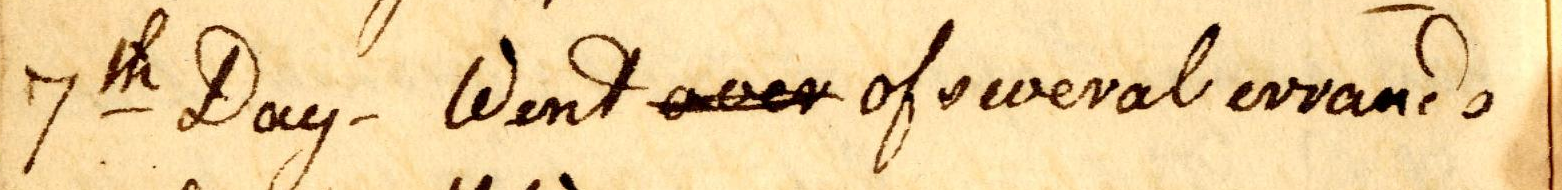7^th Day- Went [over] of several errands
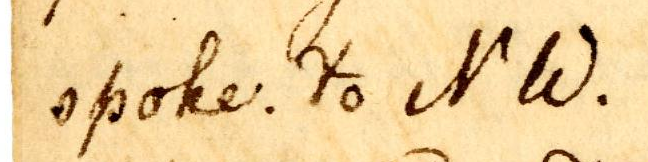spoke. to NW.
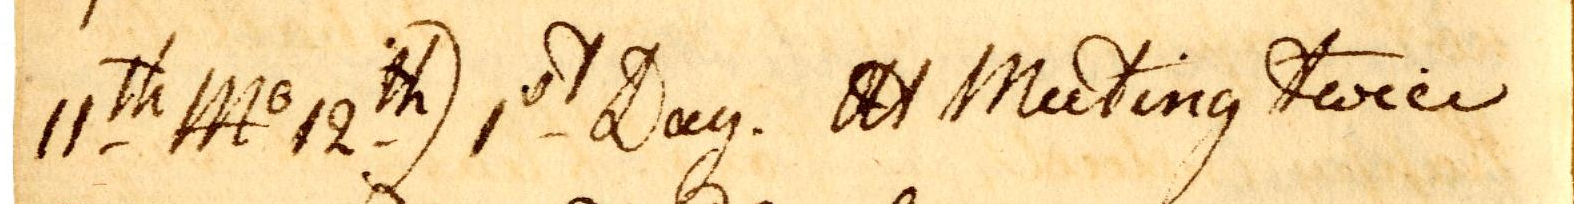11^th M^o 12^th) 1^st Day. At Meeting twice
